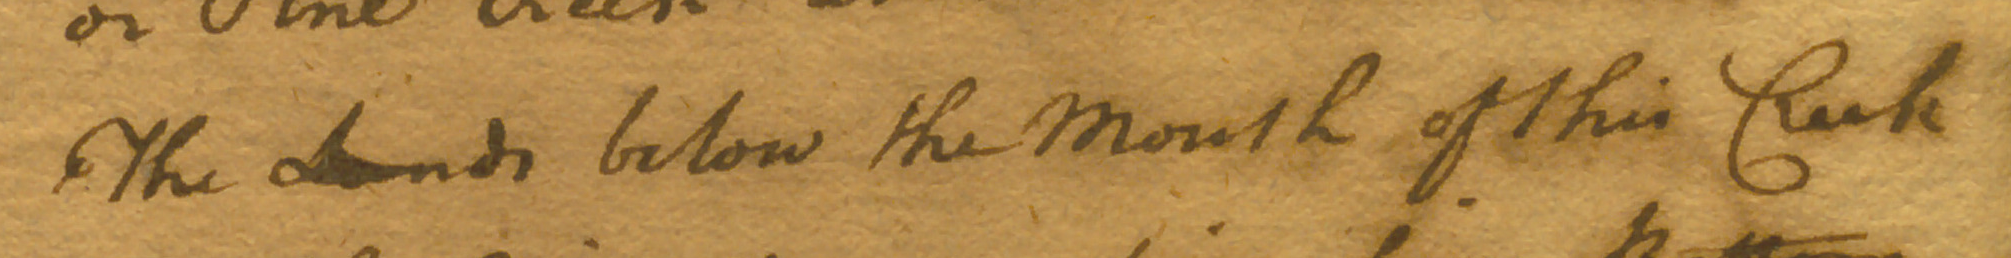The Lands below the mouth of this Creek
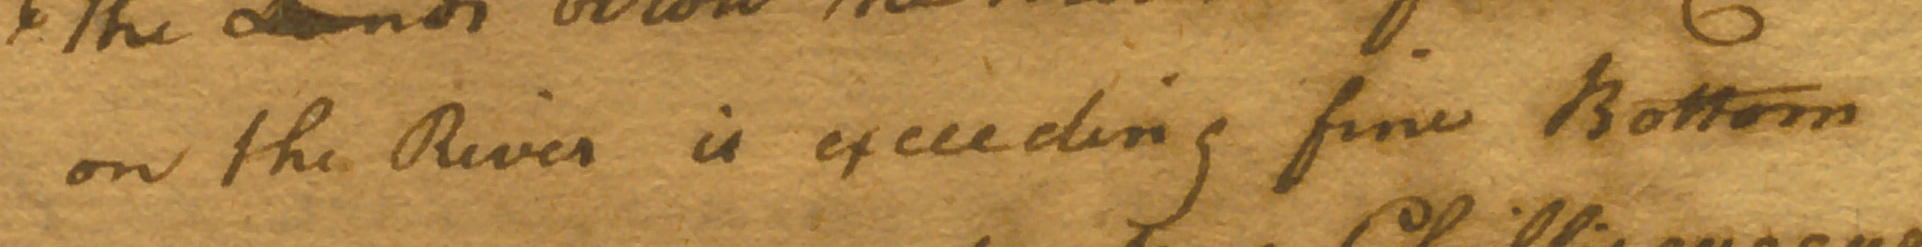on the River is exceeding fine Bottom
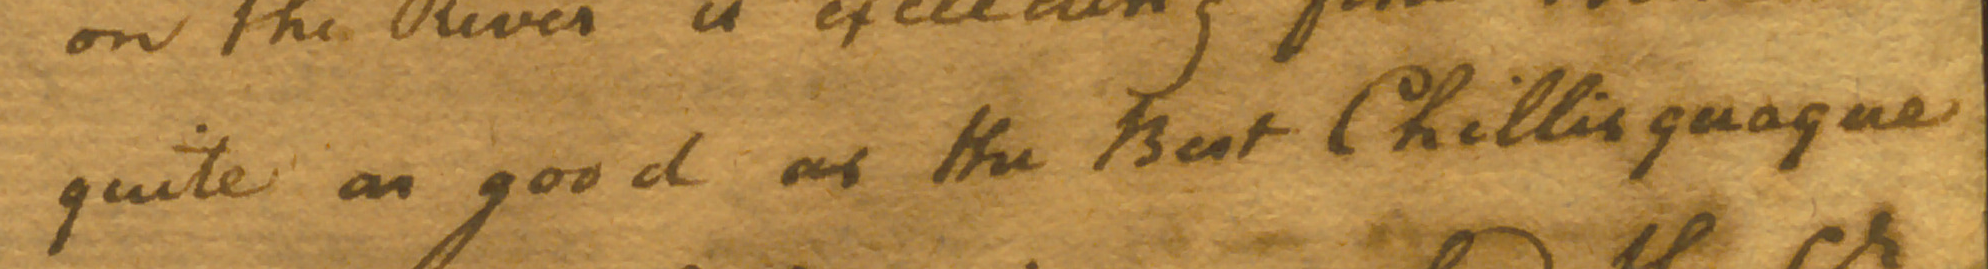quite as good as the Best Chillisquaque
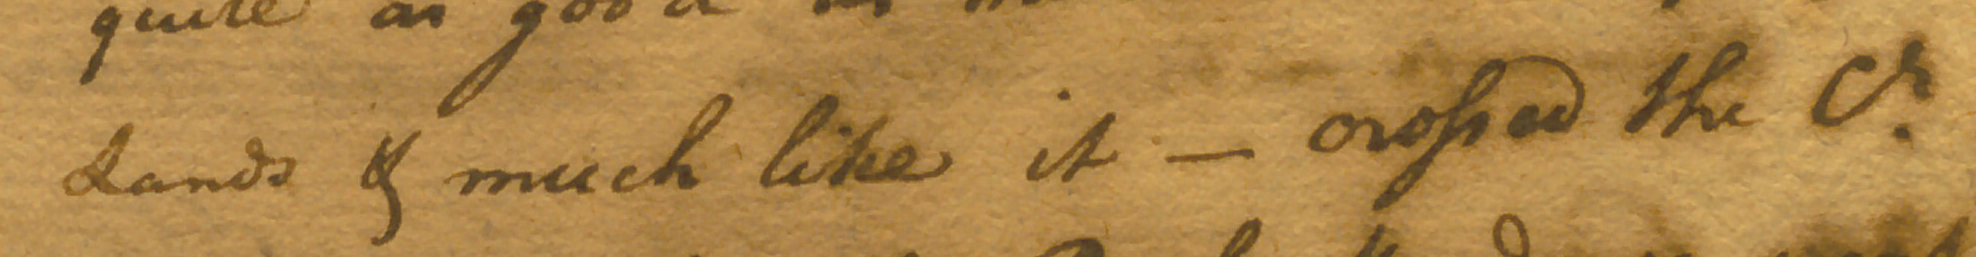Lands & much like it- crossed the C^r.
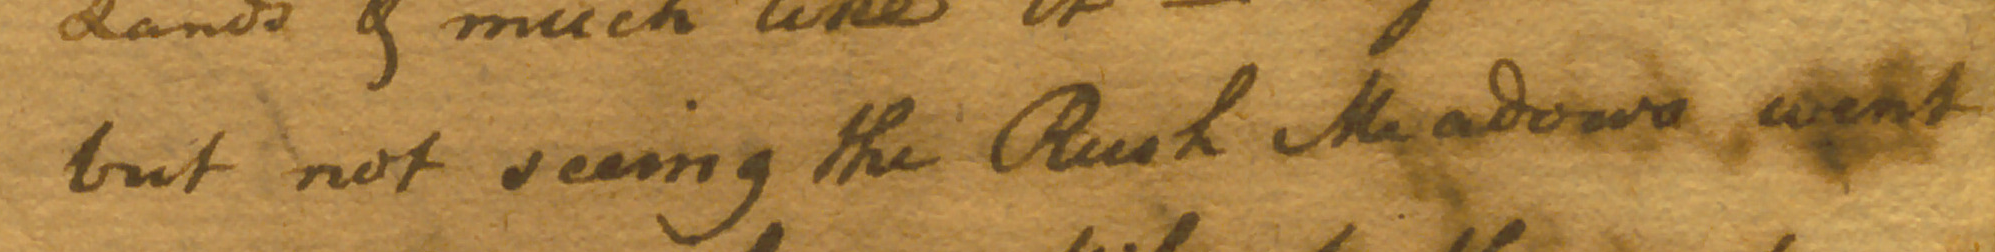but not seeing the Rush Meadows went
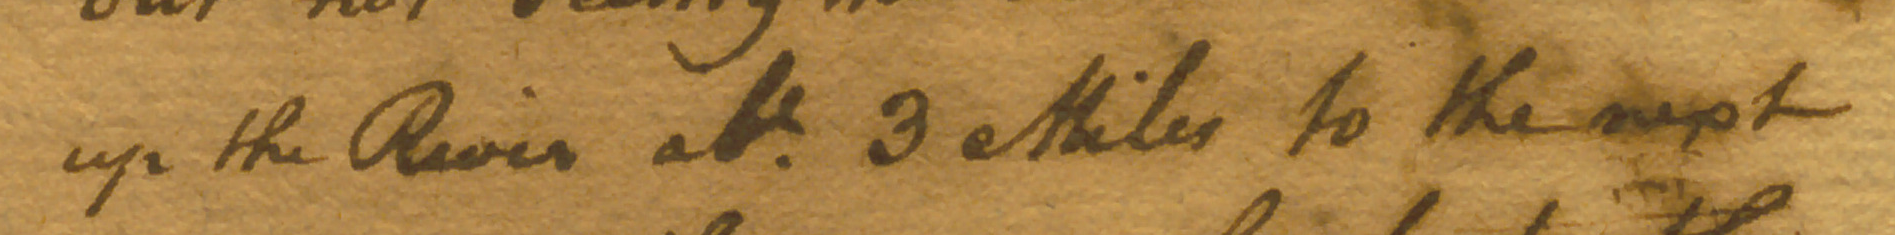up the River ab^t. 3 Miles to the next
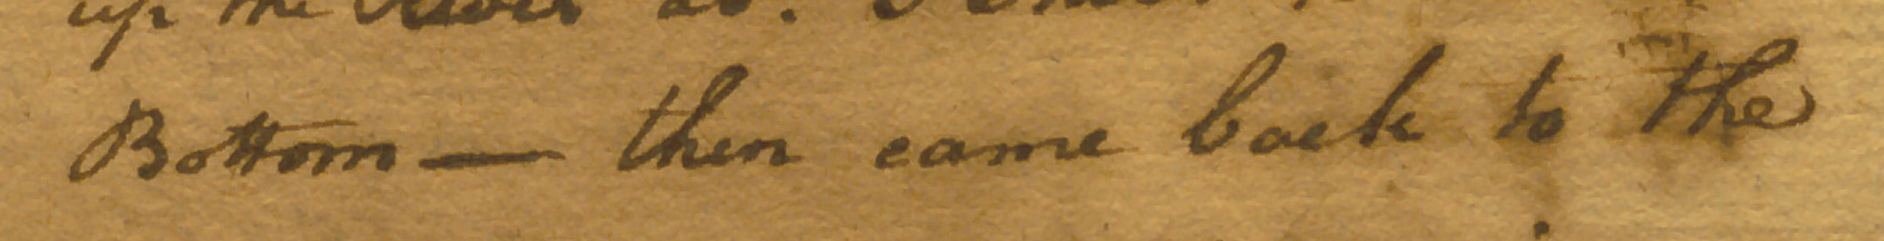Bottom- then came back to the
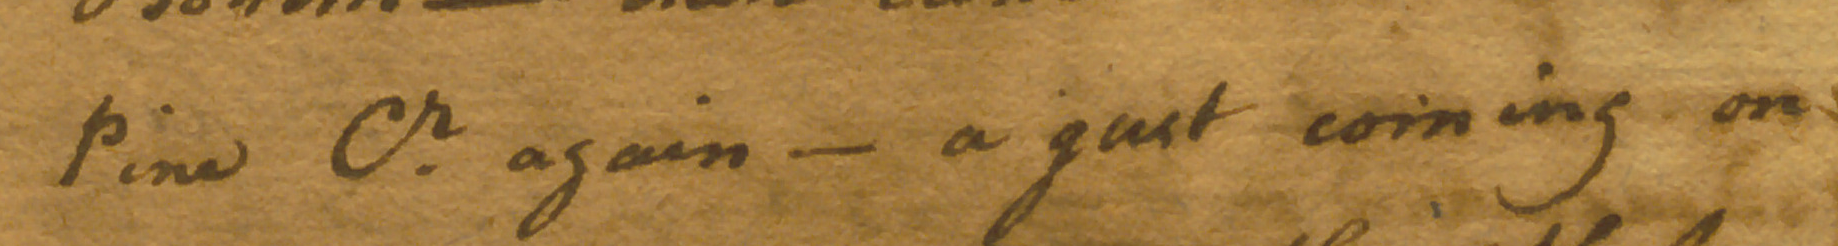Pine C^r. again- a guest coming on
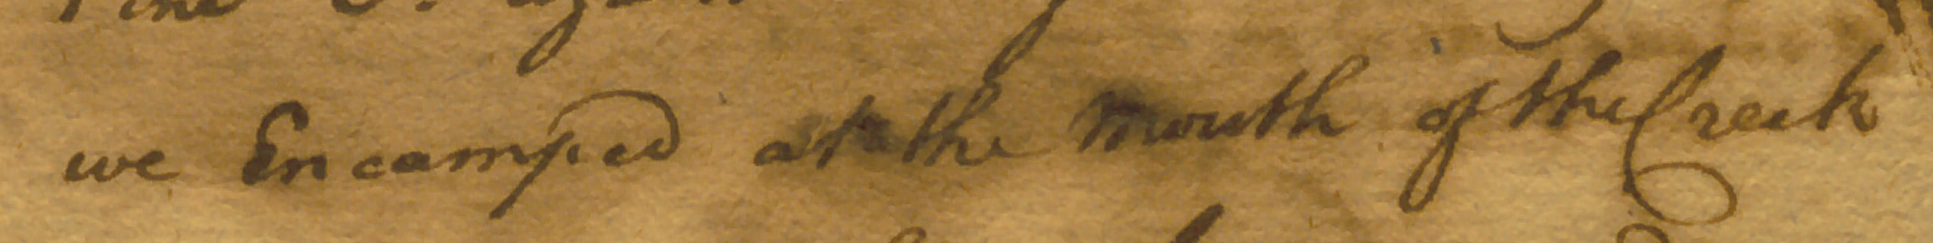we Encamped at the mouth of the Creek
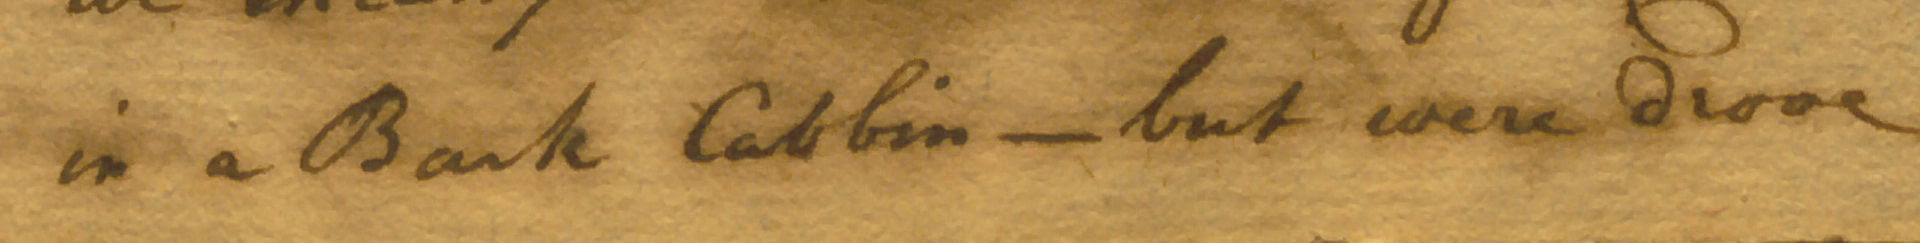in a Bank Cabbin- but were drove
